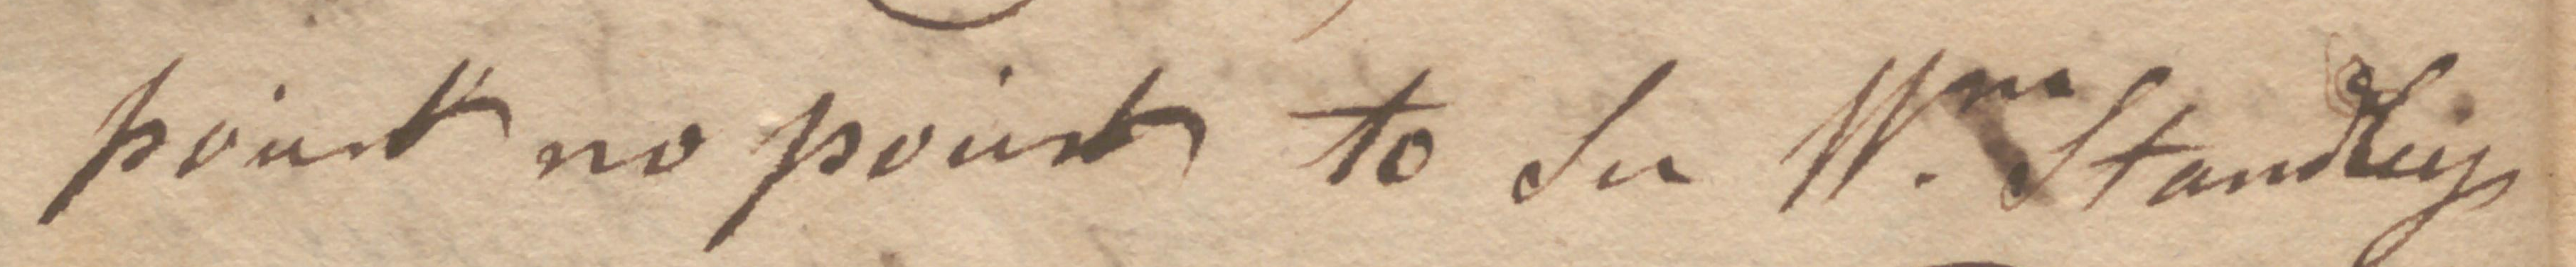point no point to See W^m. Standbys
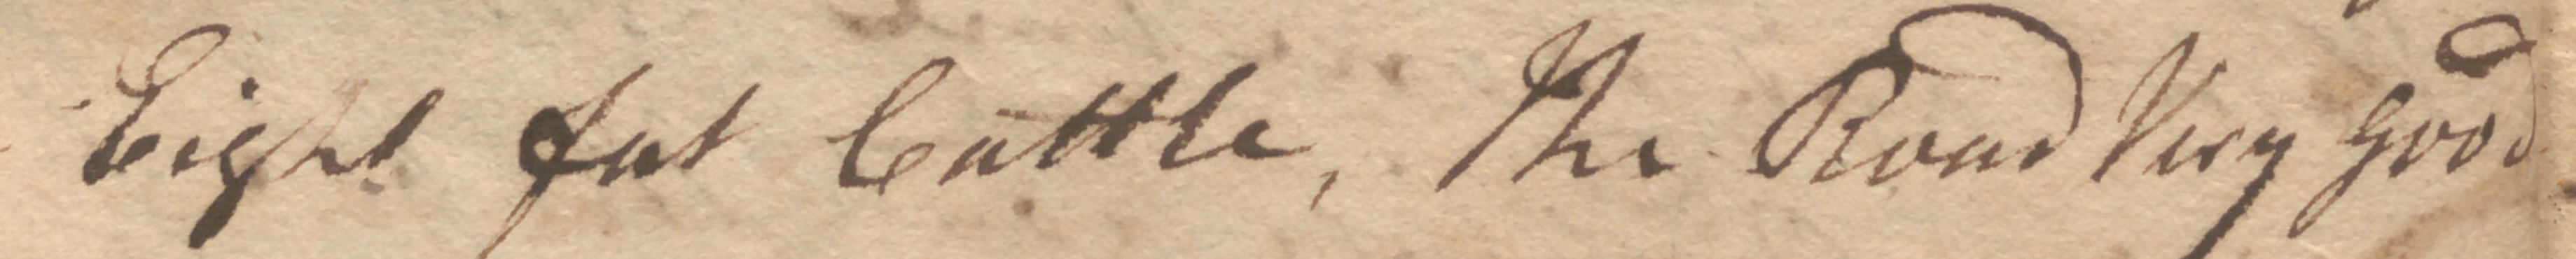Eight fat Cattle. The Road Very Good
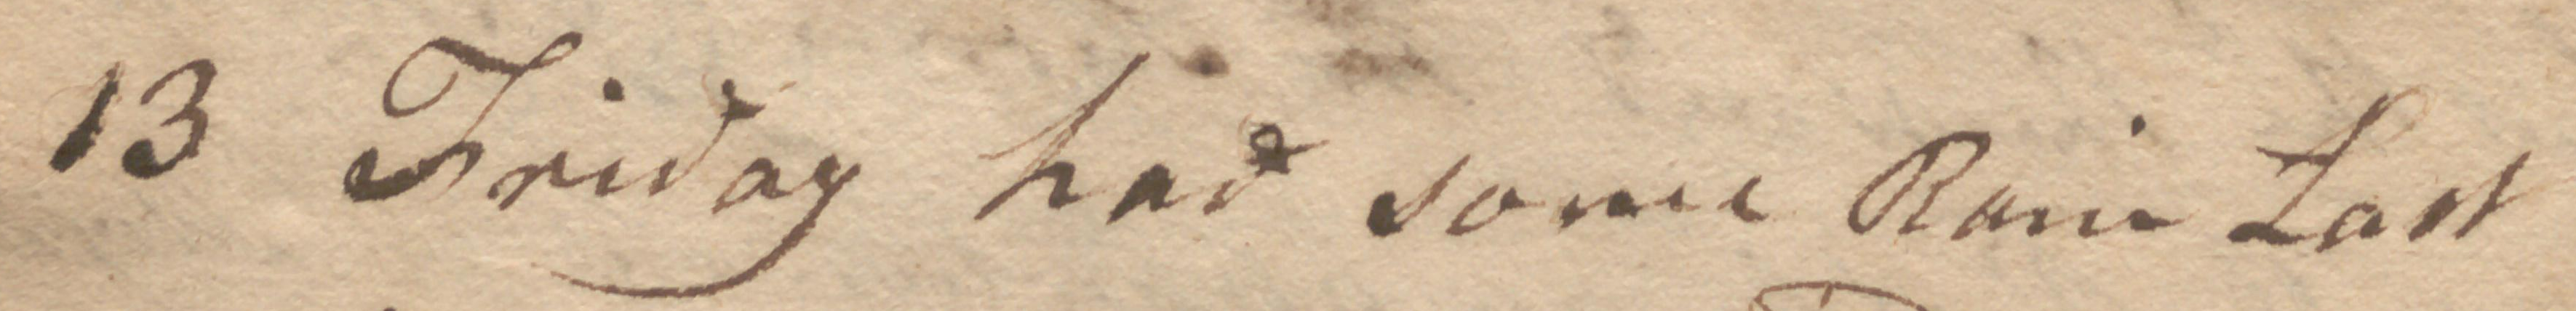13 Friday had some Rain Last
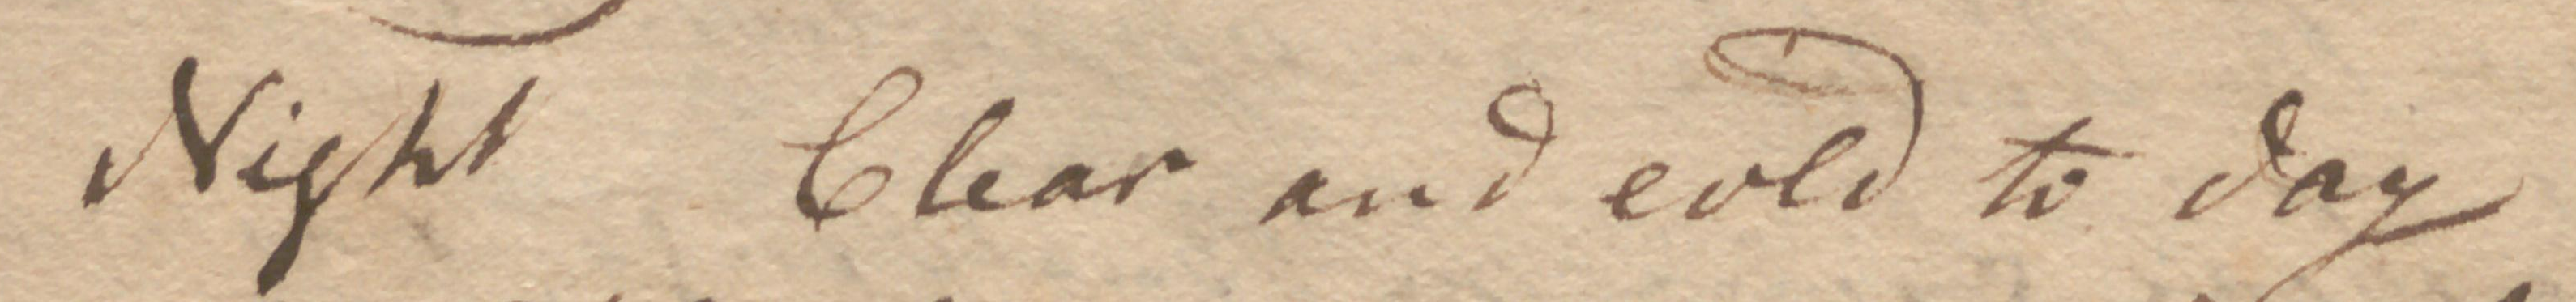Night Clear and cold to day
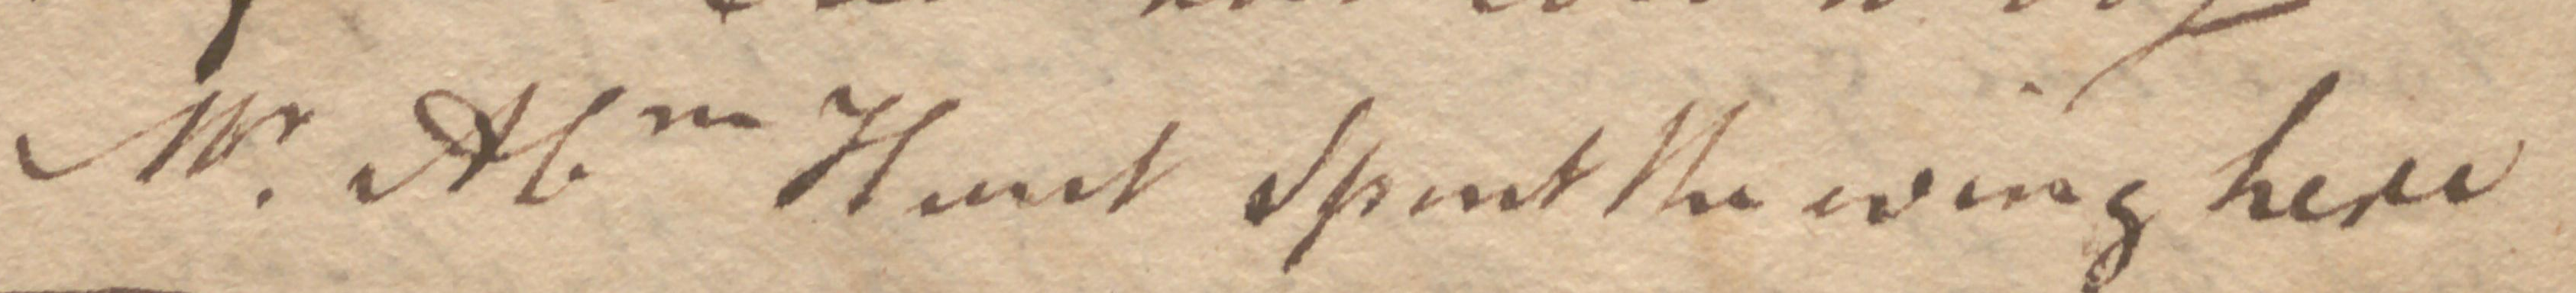M^r. Ab^m Hunt spent the eving here
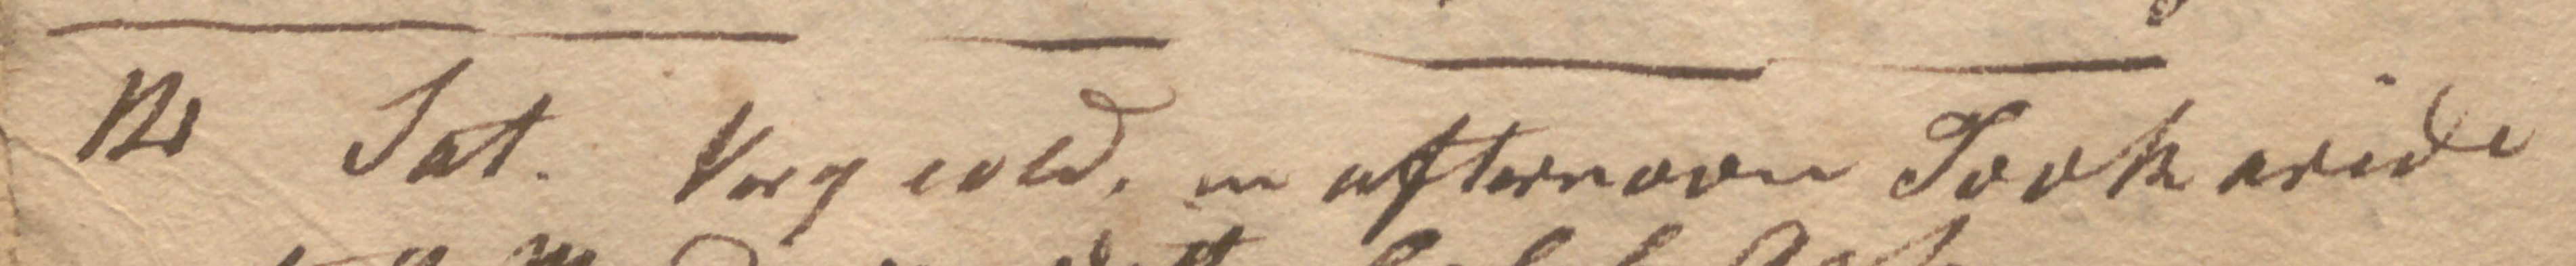14 Sat. Very cold, in afternoon Took a ride
